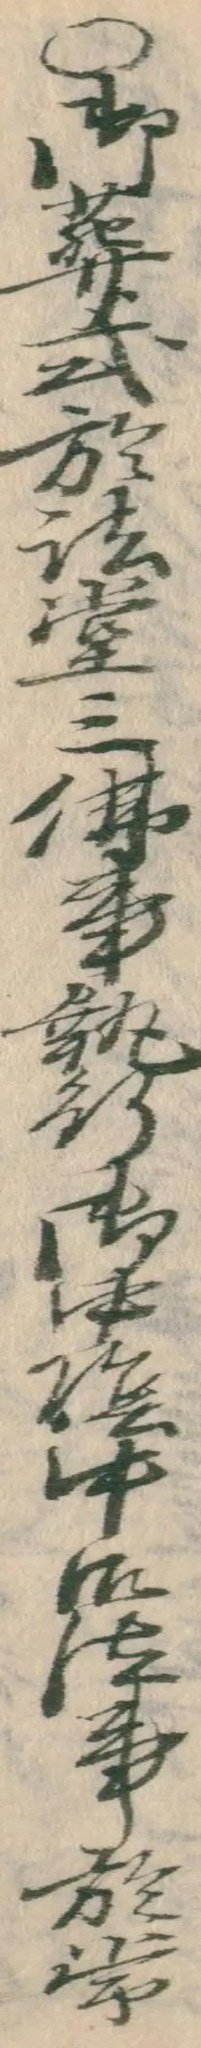○御葬式於法堂三仏事執行御中陰中御法事於常
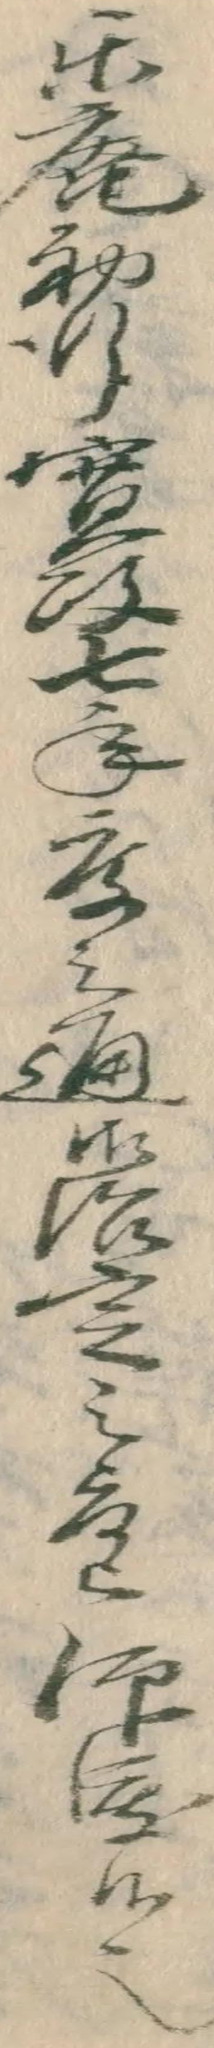楽庵勤行寛政七年度之通御治定之旨被仰渡候也
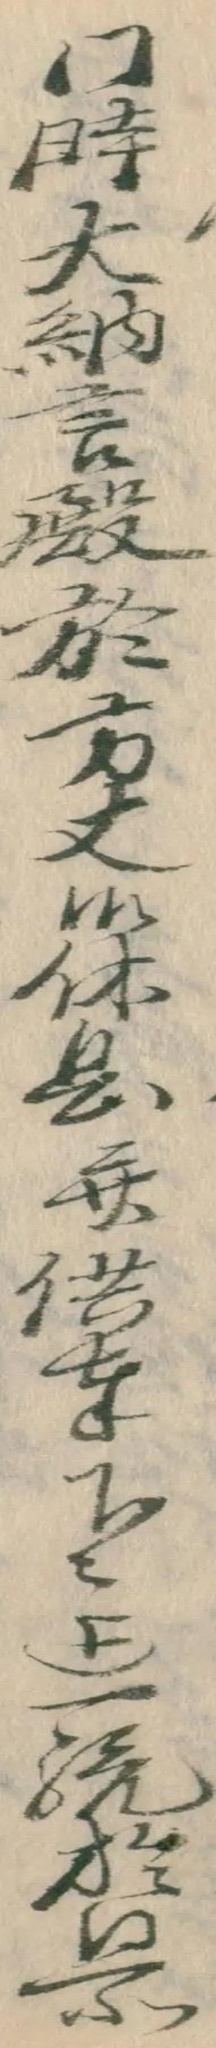同時大納言殿於方丈御休息并供奉下々迄一統於同所
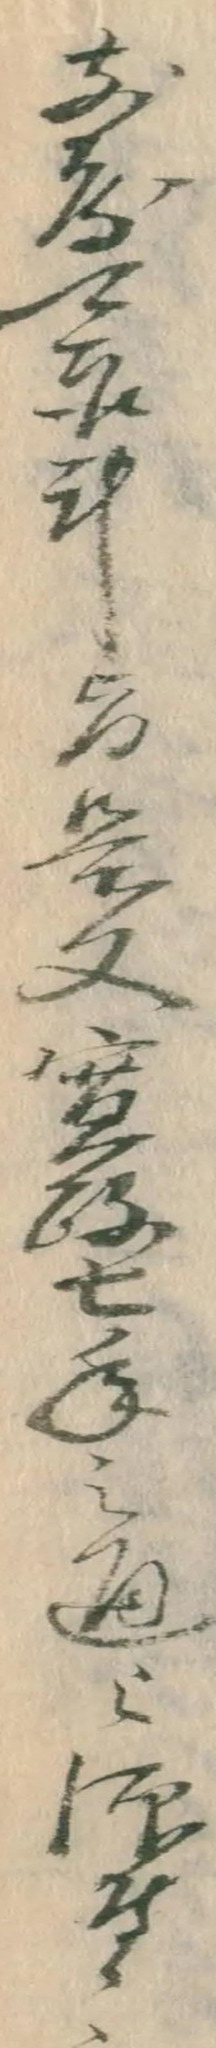支度可取斗旨是又寛政七年之通被仰付候也

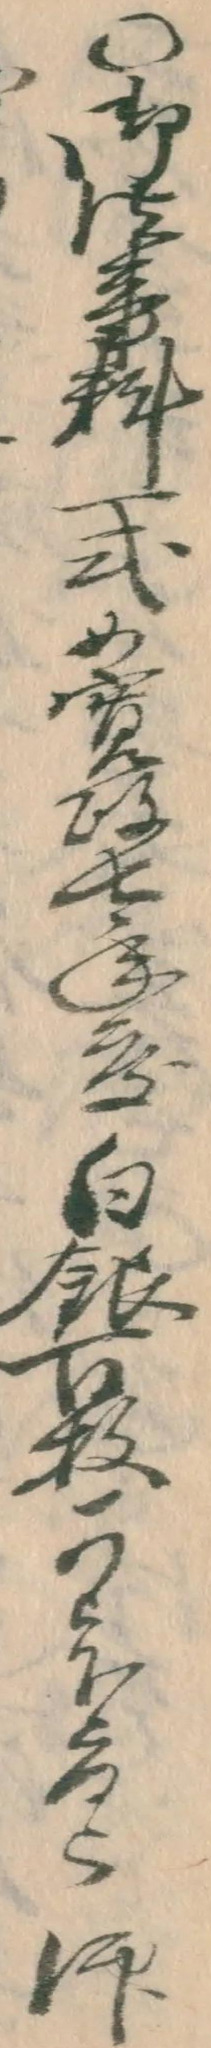○御法事料一式如寛政七年度白銀百枚可被下旨被仰
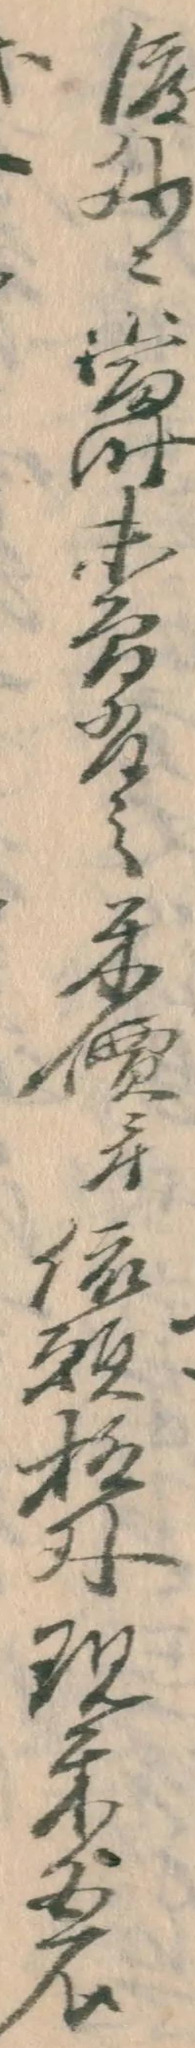渡外ニ當時未曽有之米価ニ付依願格外現米五石
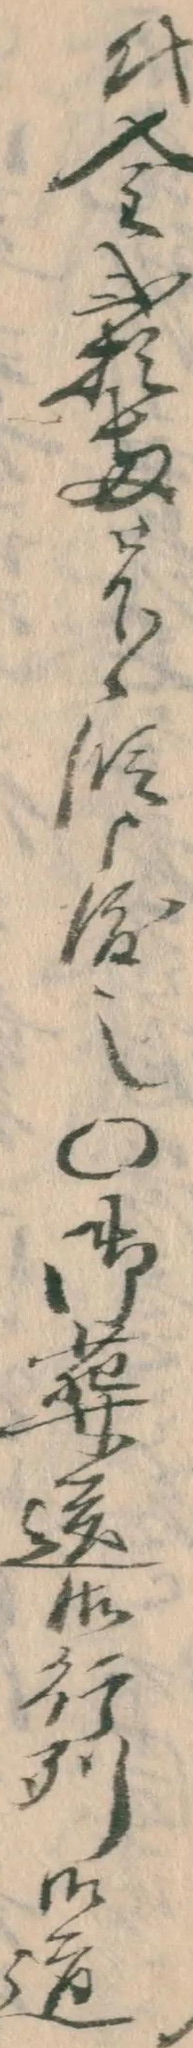代金弐拾両被下候段申渡也〇御葬送御行列御道
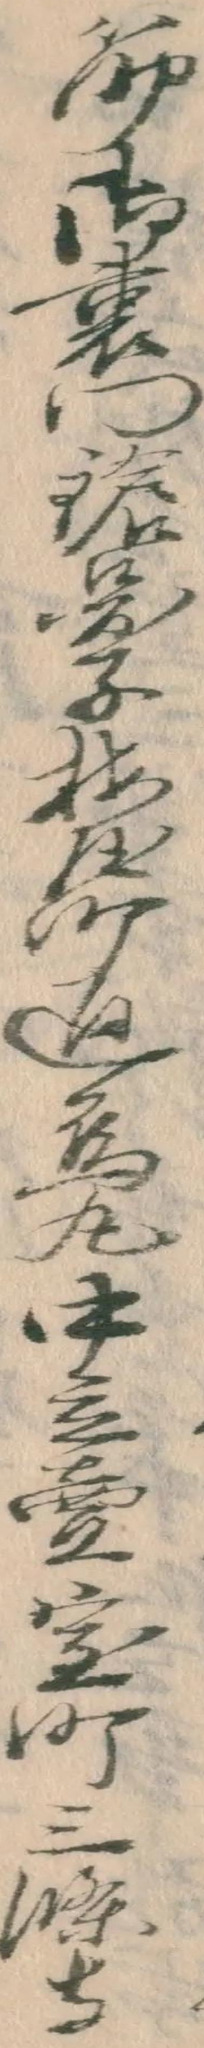筋御裏門鋸図子梅屋町通為丸中立売宝町三條寺
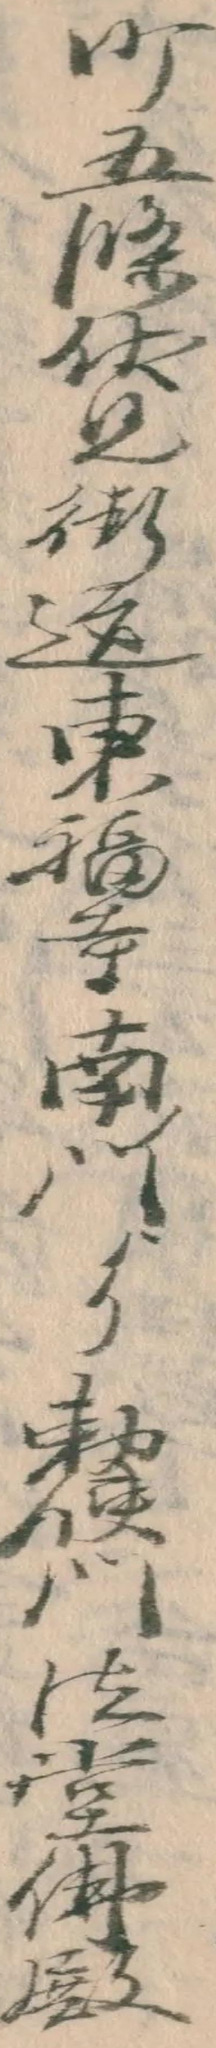町五條伏見街道東福寺南門より勅使門法堂仏殿
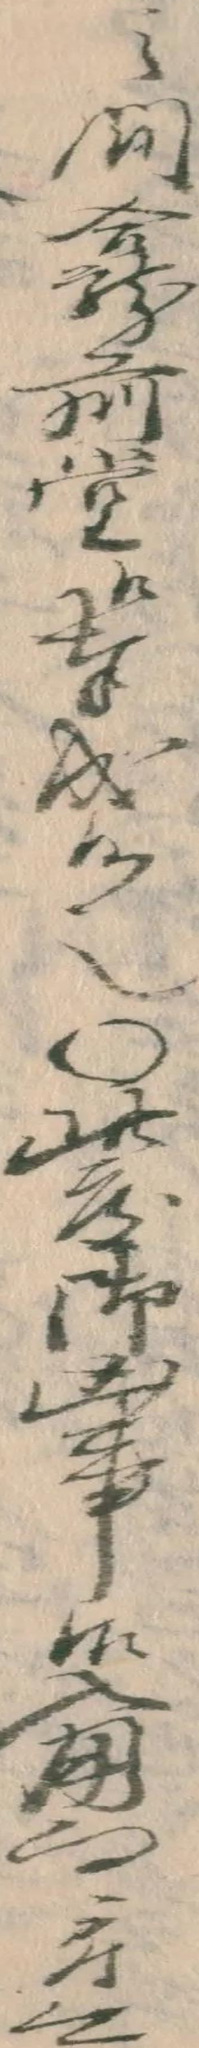之間對前堂江奉成候之○此度御凶事御入用向ニ付今
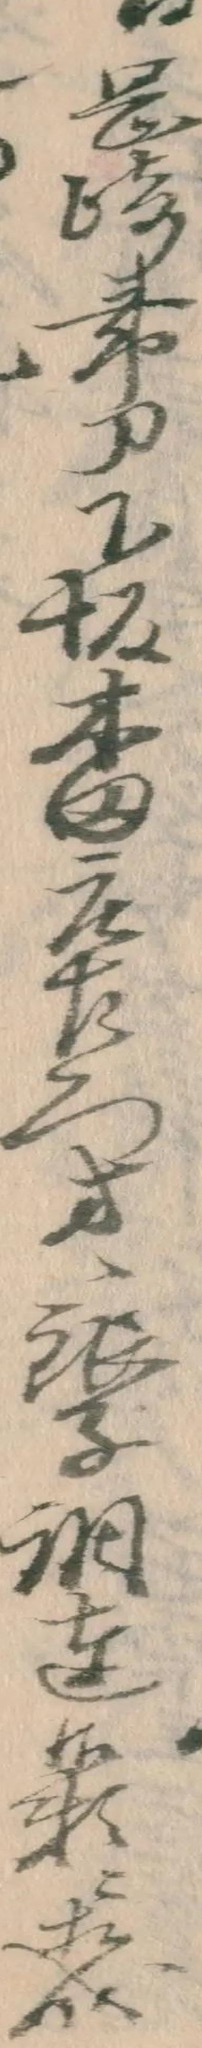日岡崎桑刀下坂木田庄左衛門方へ銀子銅達御頼ニ相成
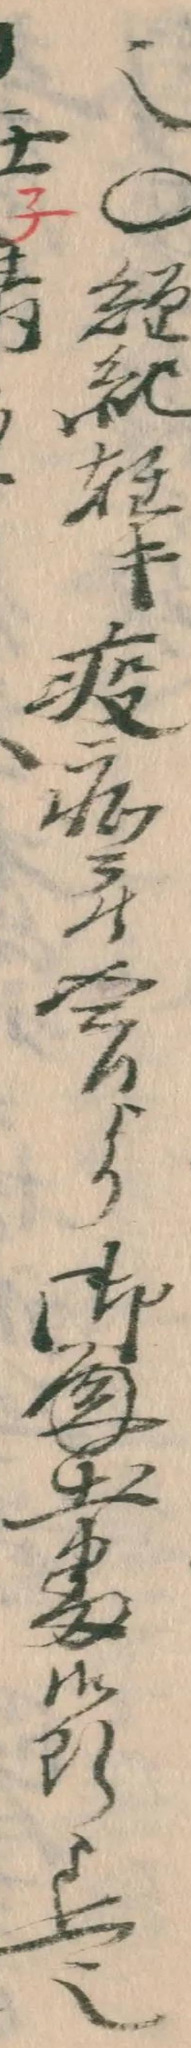也○経紀軽キ疫病ニ付今日より御出番御断申上也
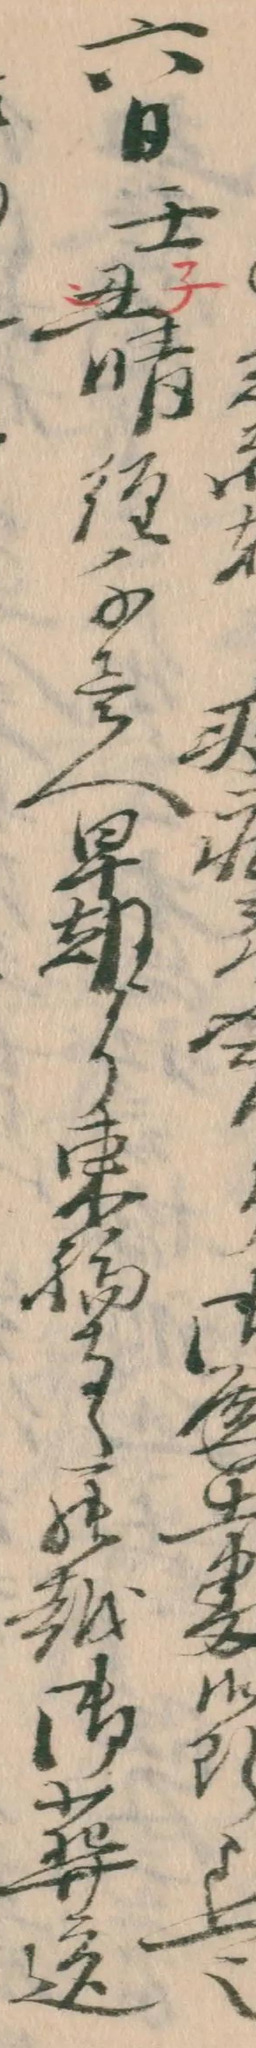六日壬丑晴経千壱人早朝より東福寺へ罷越御葬送
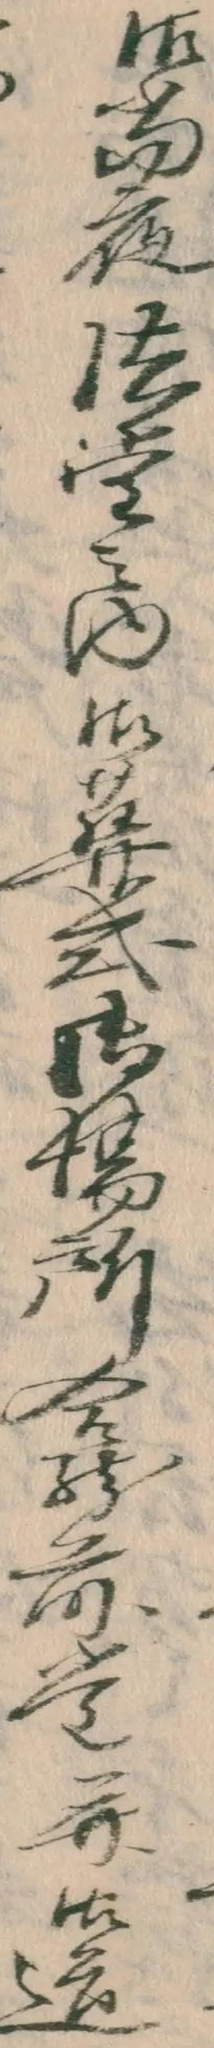御當夜法堂之内御葬式御場所合残前堂幷御道
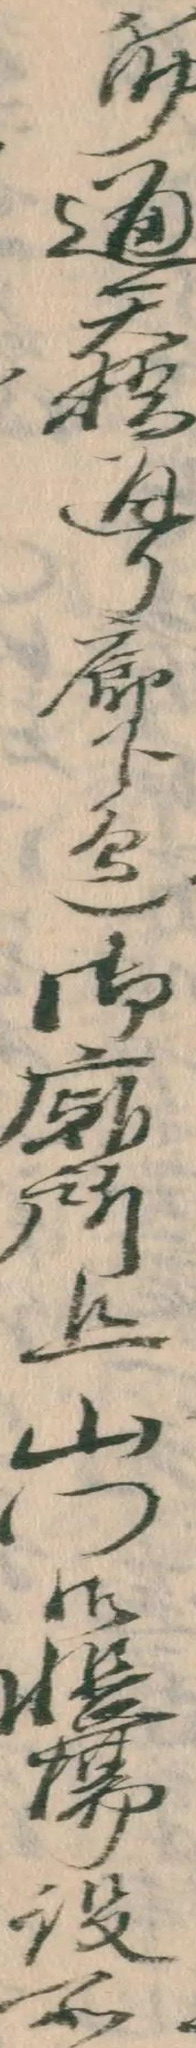筋通天橋通り廊下邊御廟所且山門御張場設所
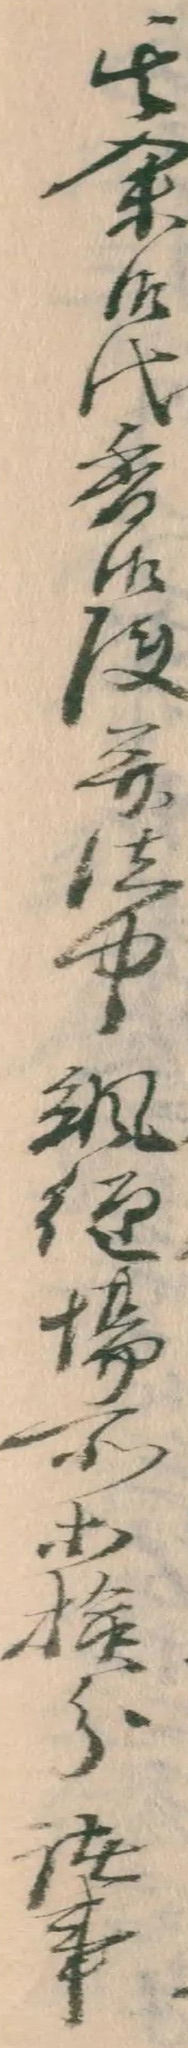其余御代香御殿并法中組経場所等検分諸事
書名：賀茂社記録. 第67冊
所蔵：国立国会図書館 National Diet Library, JAPAN
